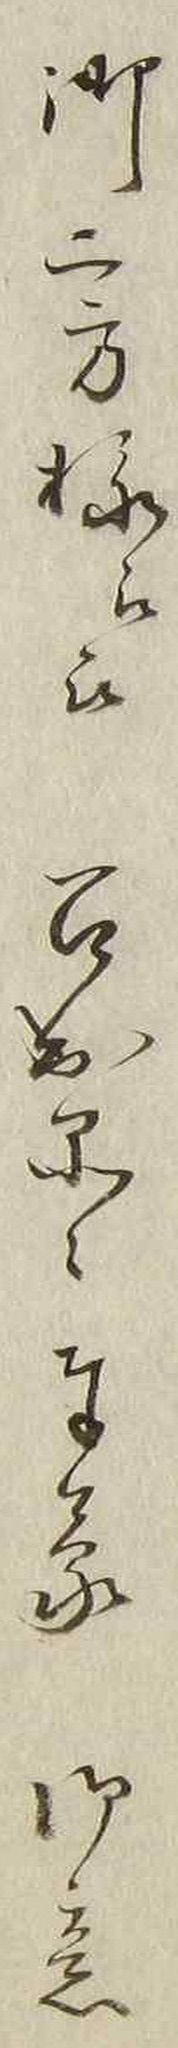御二方様江被召出品々奉蒙御意
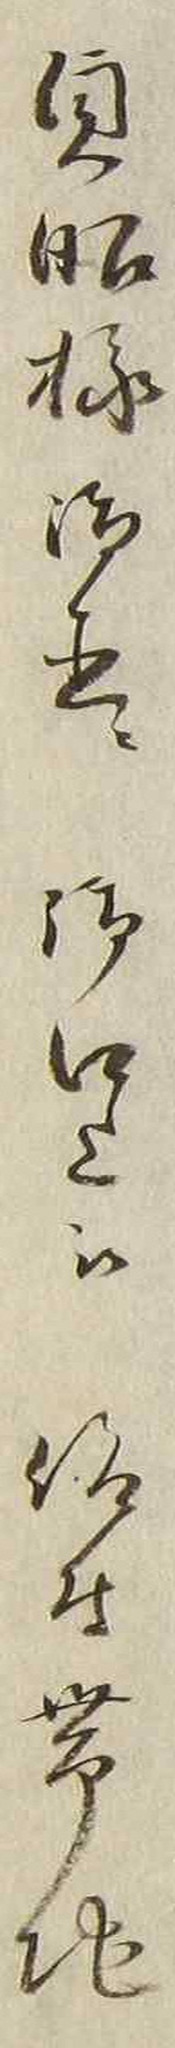貞昭様御直ニ御口上被仰付帯地

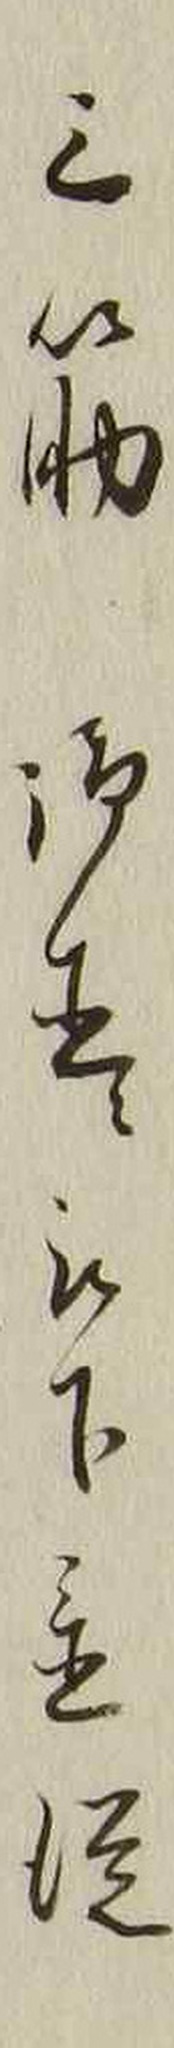三筋御直ニ被下置従
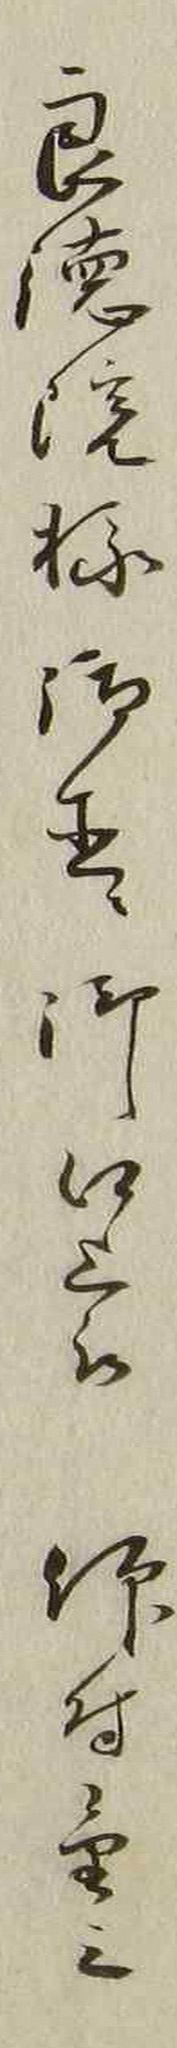良徳院様御直ニ御口上被仰付金三
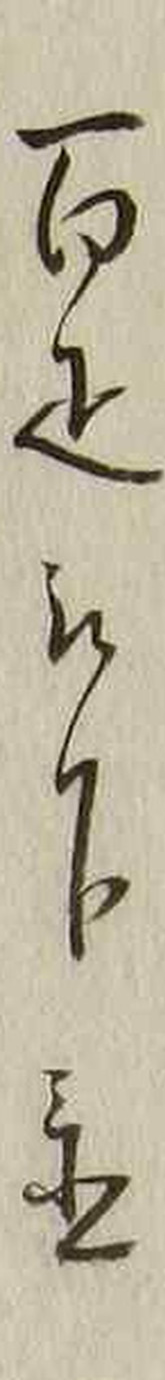百疋被下置
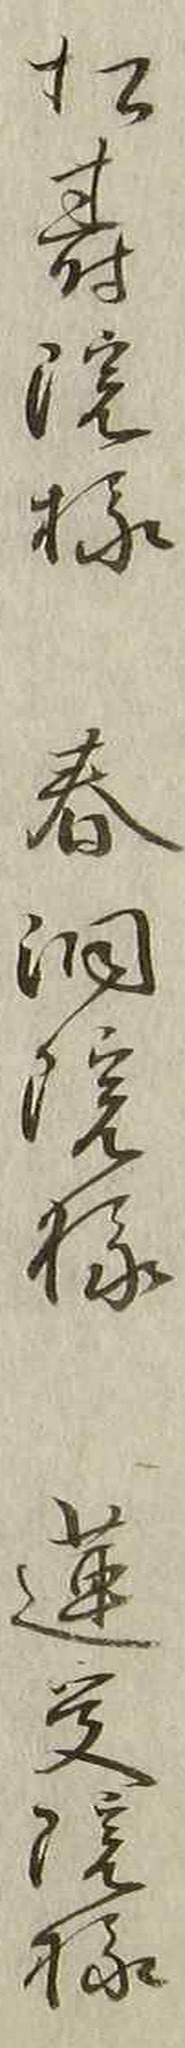松寿院様春洞院様蓮受院様
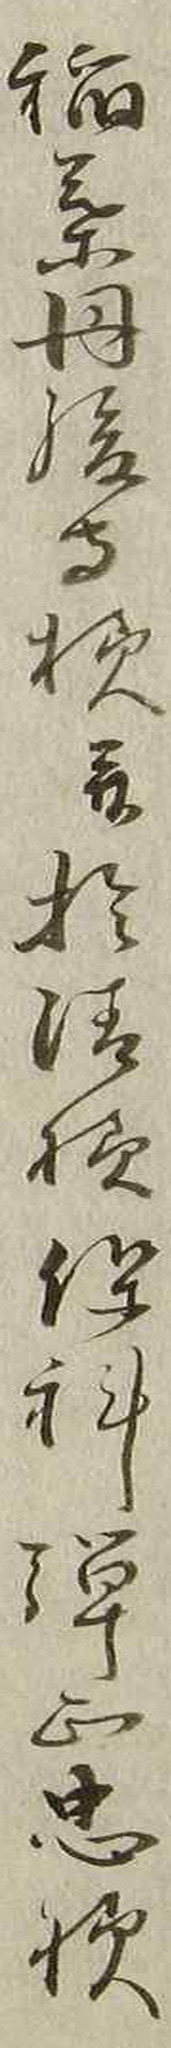稲葉丹後守様并於清様保科弾正忠様
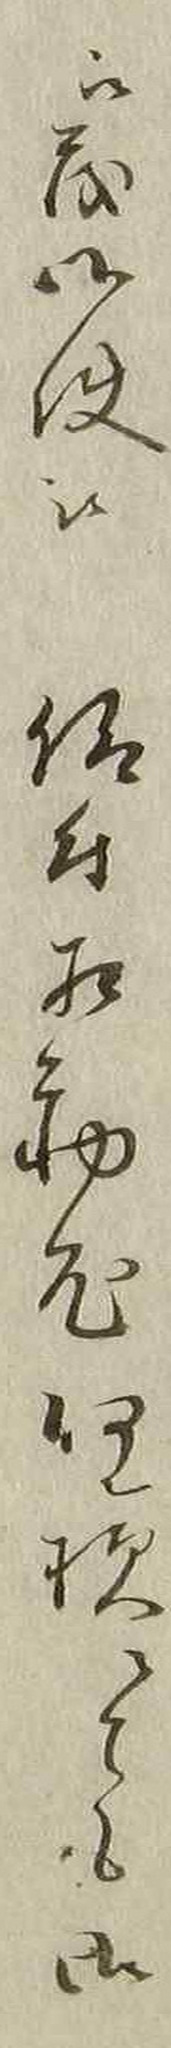江茂御使被仰付相勤尤何レ様ニても御
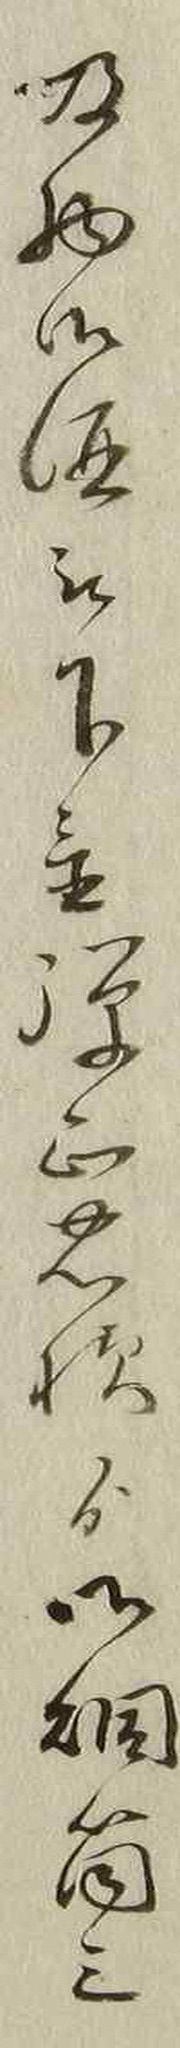吸物御酒被下置弾正忠様ゟ御烟筒三
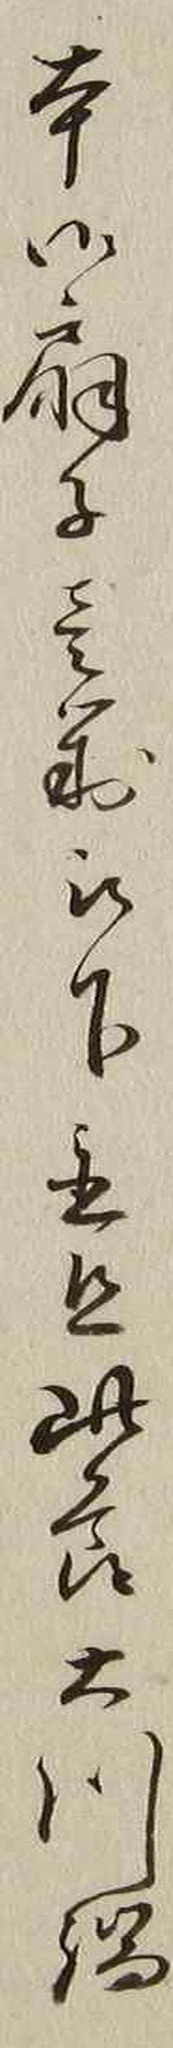本御扇子壱対被下置旦此節大川端
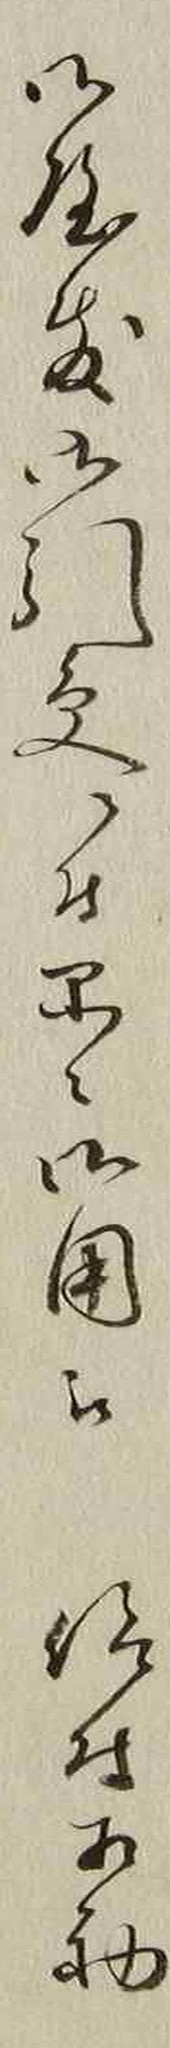御屋敷御引受ニ付品々御用被仰付相勤
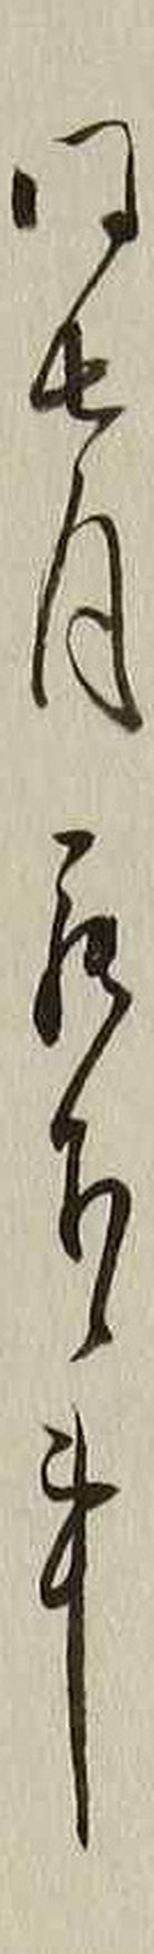同七月罷下候事
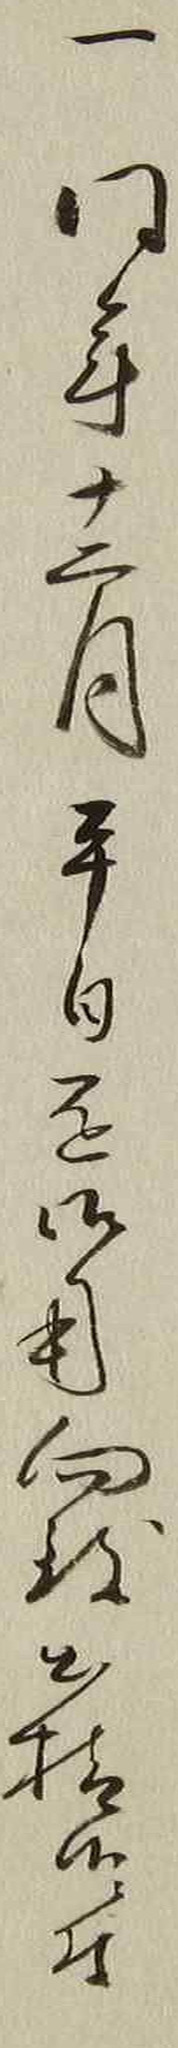一同年十二月平日懸御用向致出精候ニ付
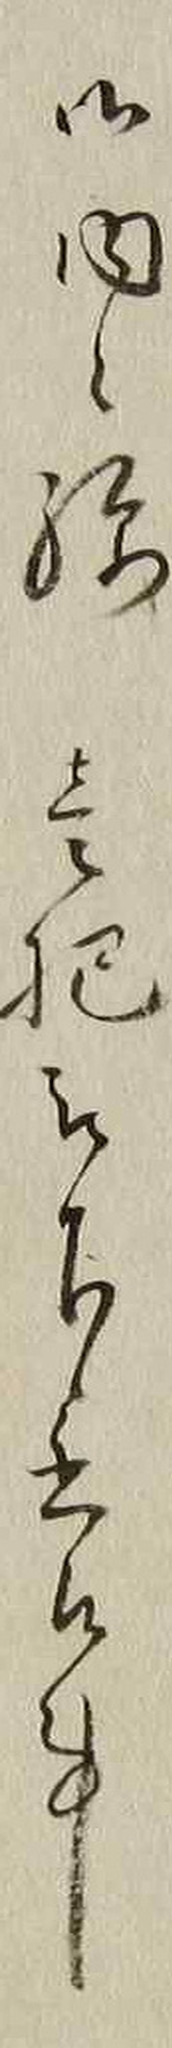御内々綿壱把被下置候事
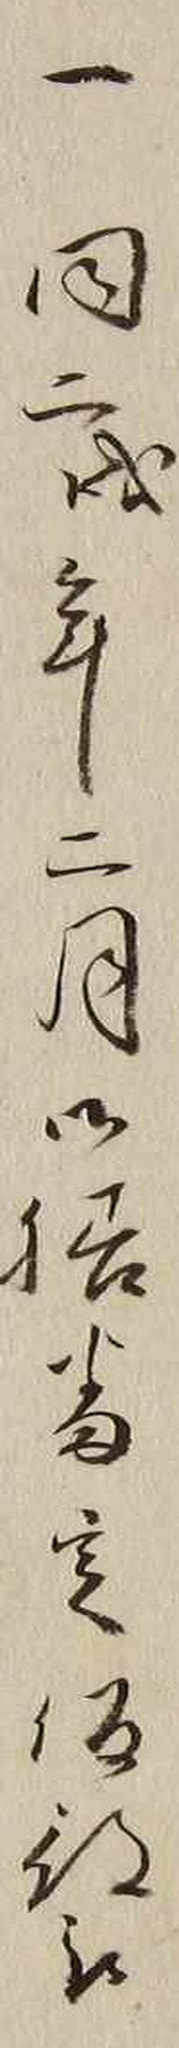一同二戌年二月御膳番定仮役被
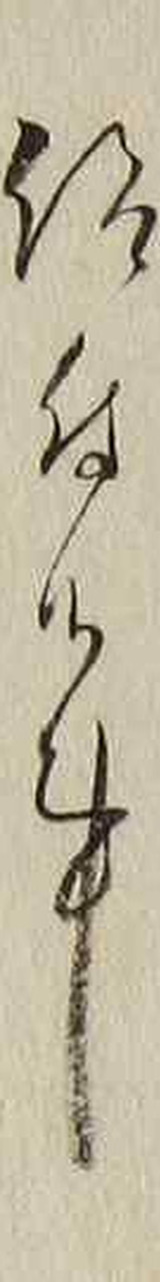仰付候事
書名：諸士系譜　巻之25　い之部25
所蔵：会津若松市立会津図書館
